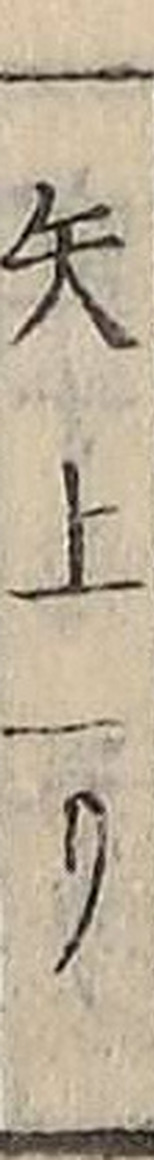矢上一リ
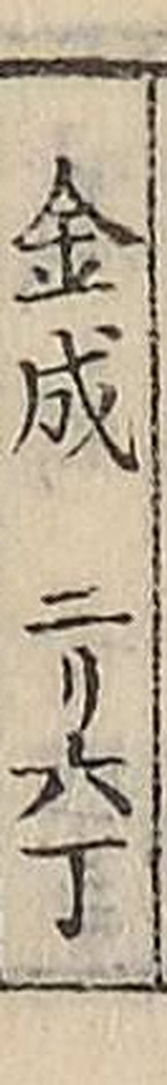金成二リ六丁
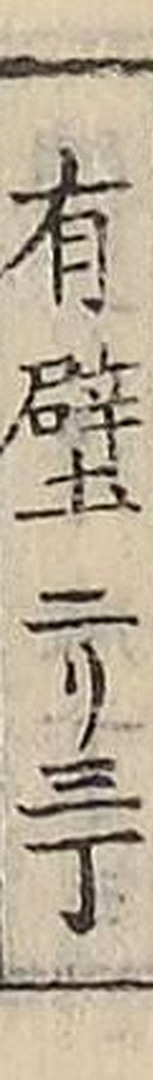有壁二リ三丁
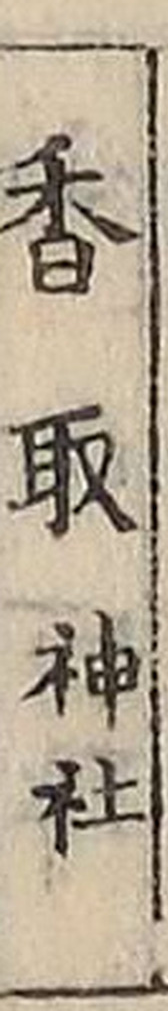香取神社
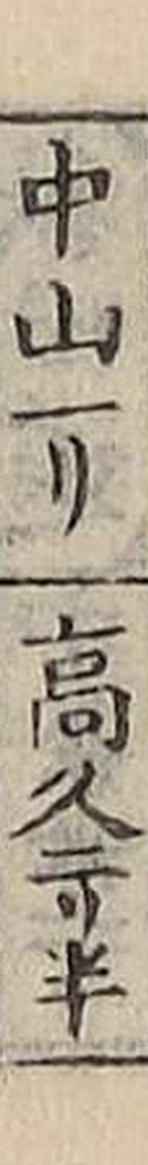中山一リ高久二リ半
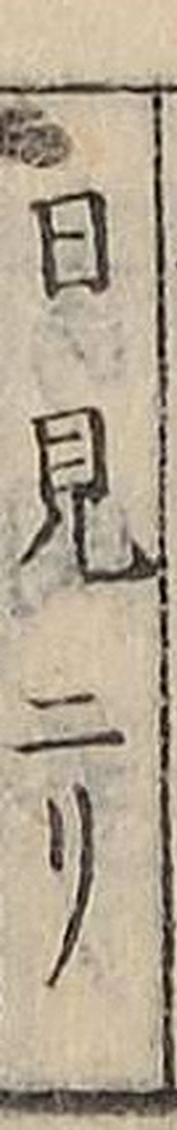日見二リ
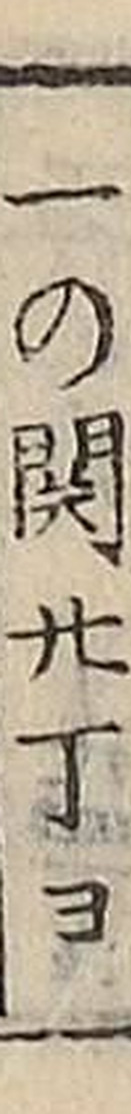一の関廿丁ヨ
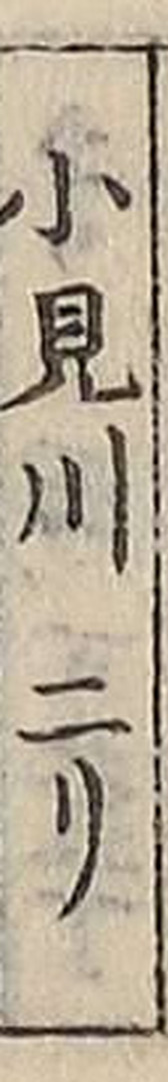小見川二リ
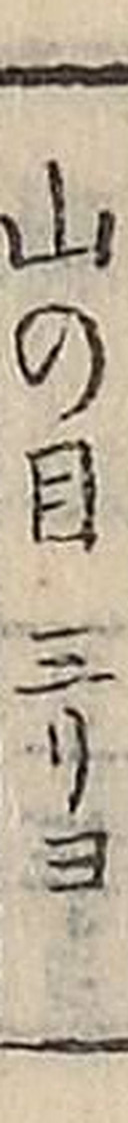山の目三リヨ
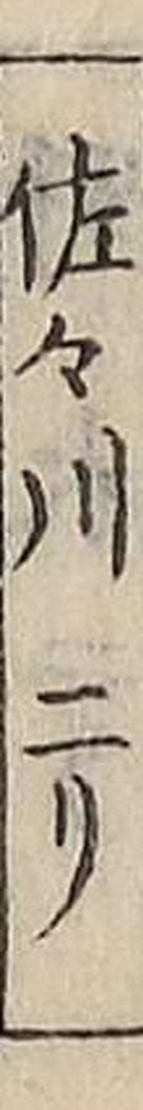佐々川二リ
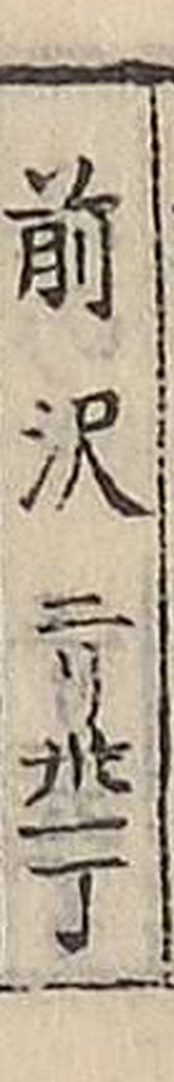前沢二リ卅一丁
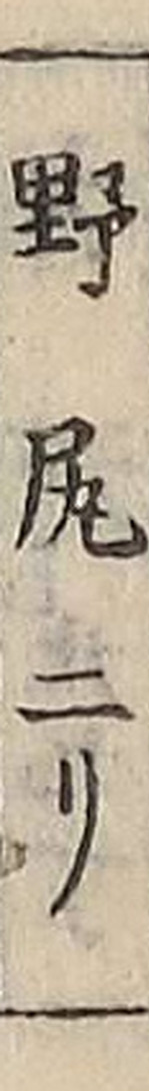野尻二リ
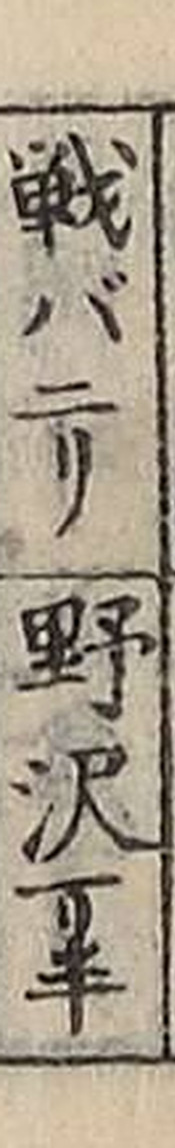戦バ二リ野沢一リ半
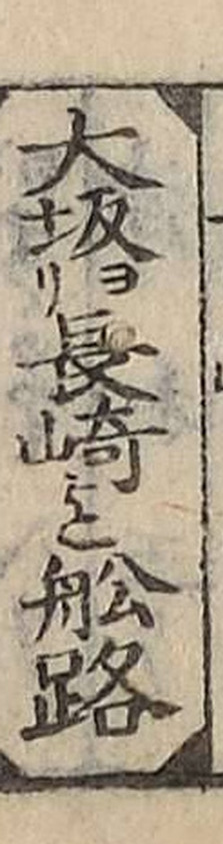大坂ヨリ長崎迄船路
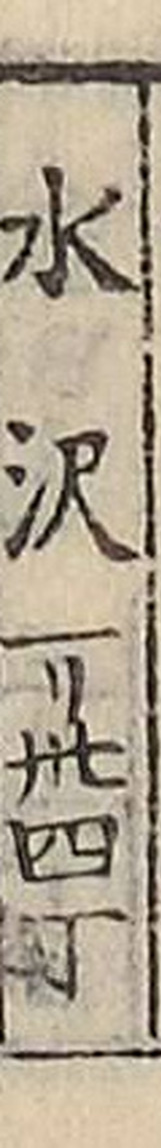水沢一リ卅四丁
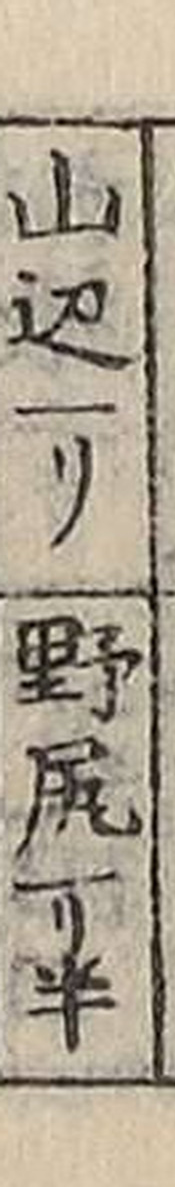山辺一リ野尻一リ半
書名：旅行用心集
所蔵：神戸大学附属図書館 国文学研究資料館
